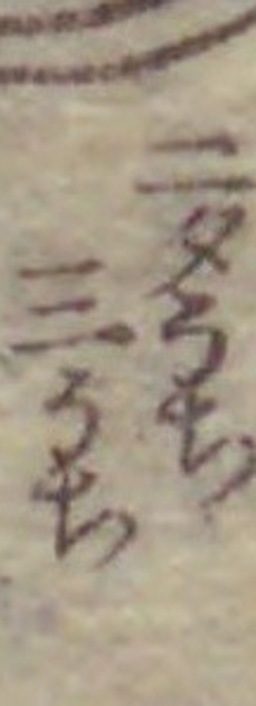三うち
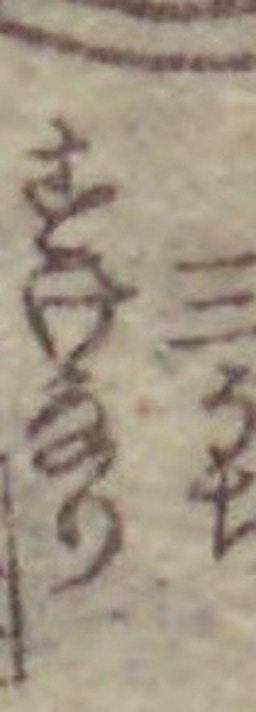すけなり
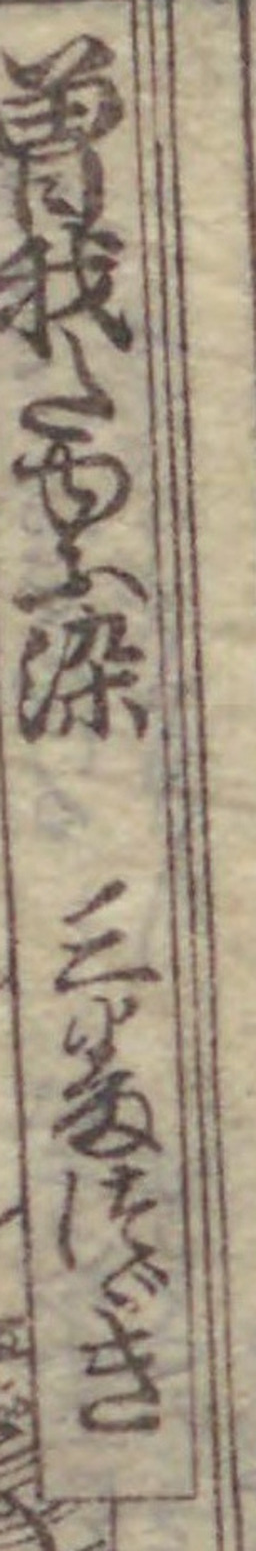曽我たゆふ染三番つゞき

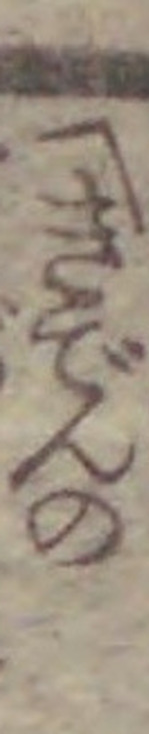〽きでんの
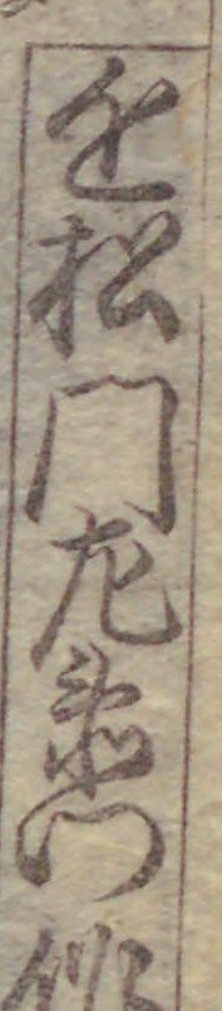近松門左衛門作
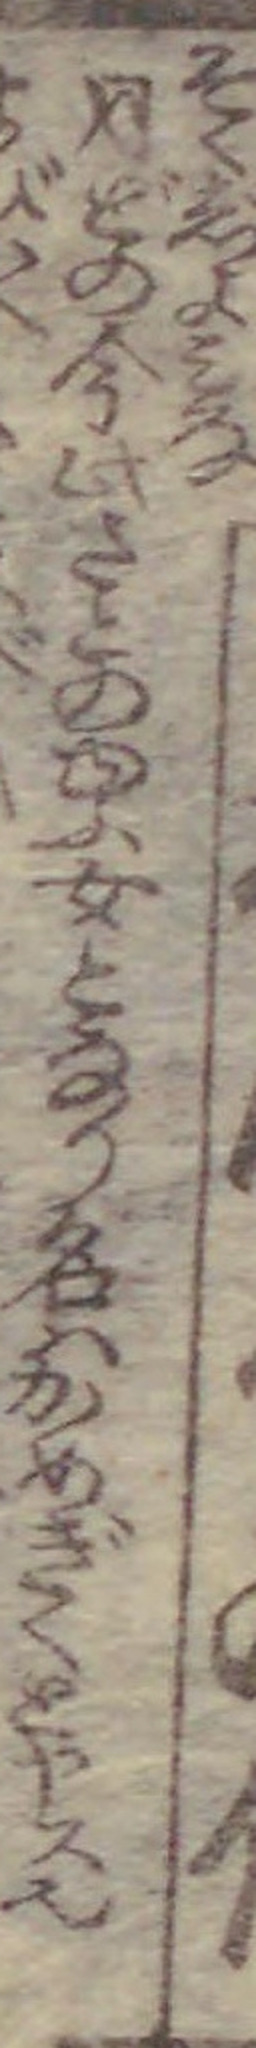月どの今此さとのゆふ女となり名はかめぎくと申す也
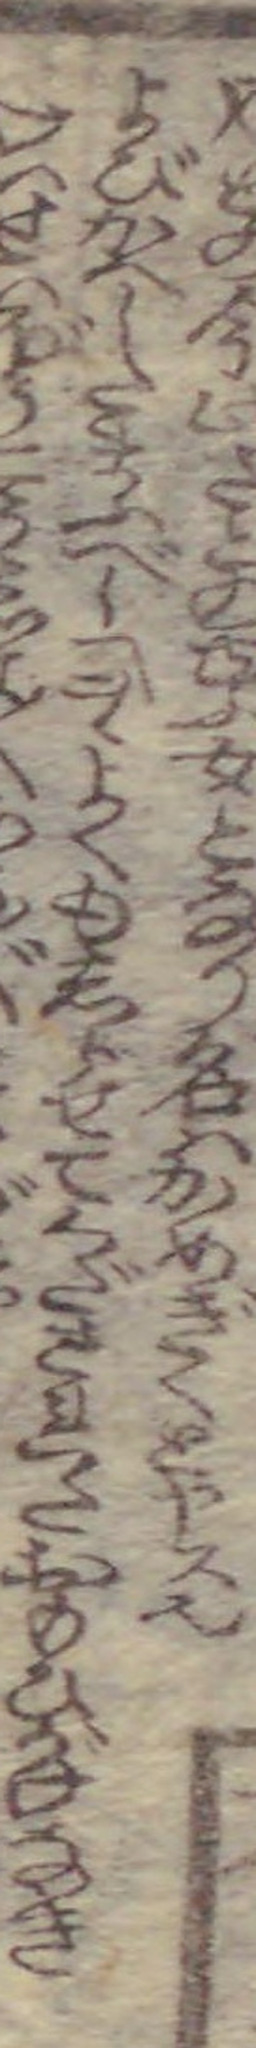よびかへしたまふべし〽ヲヽよくもしらせてくだされたおもひがけなき
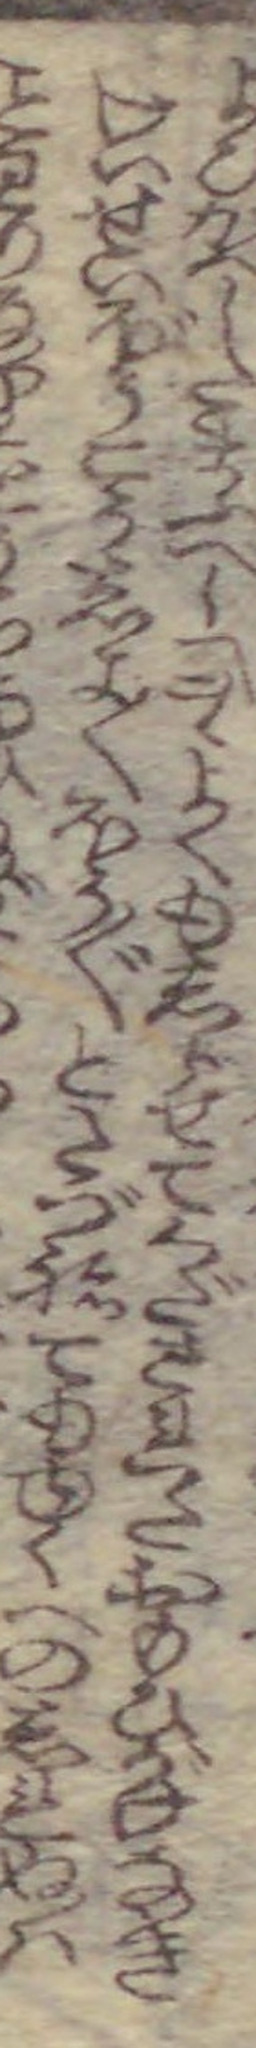けいせいぼうこうしよ〳〵ほう〴〵とたづねてもゆくへのしれぬは
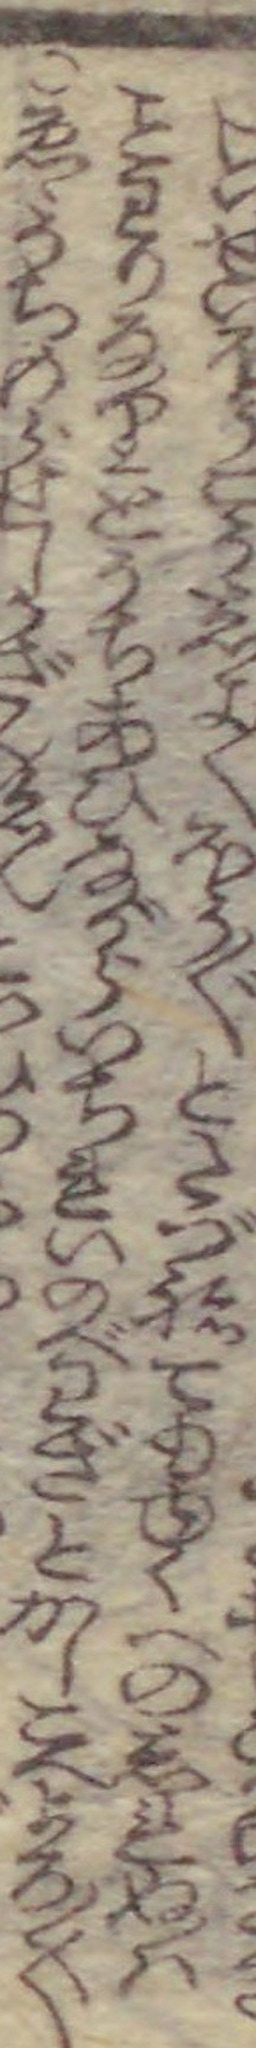ことわりなりとうちあひながらいちれいのべわざとかしこへよろ〳〵〳〵
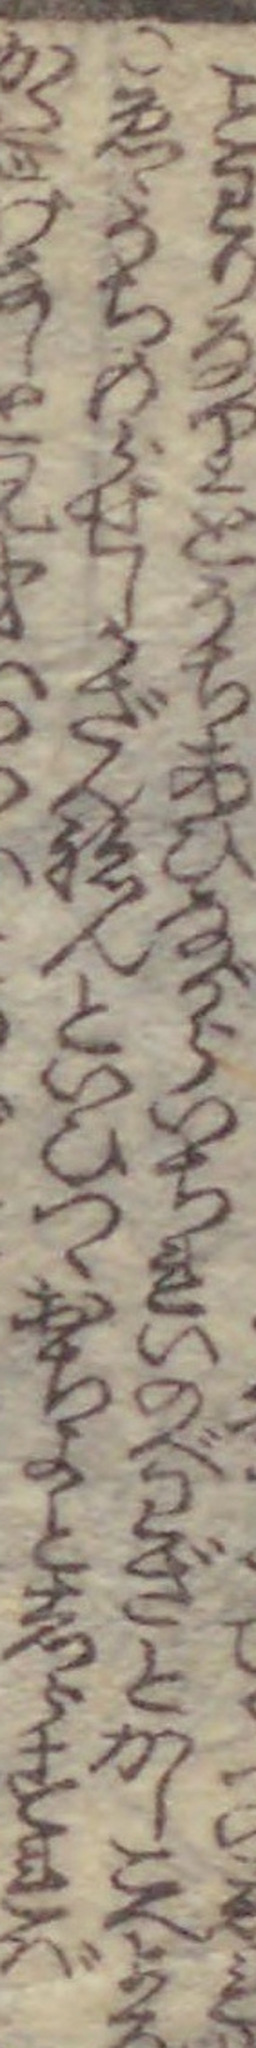○ゑゝうちもらせしかざんねんといひつゝおちよとしらすれば
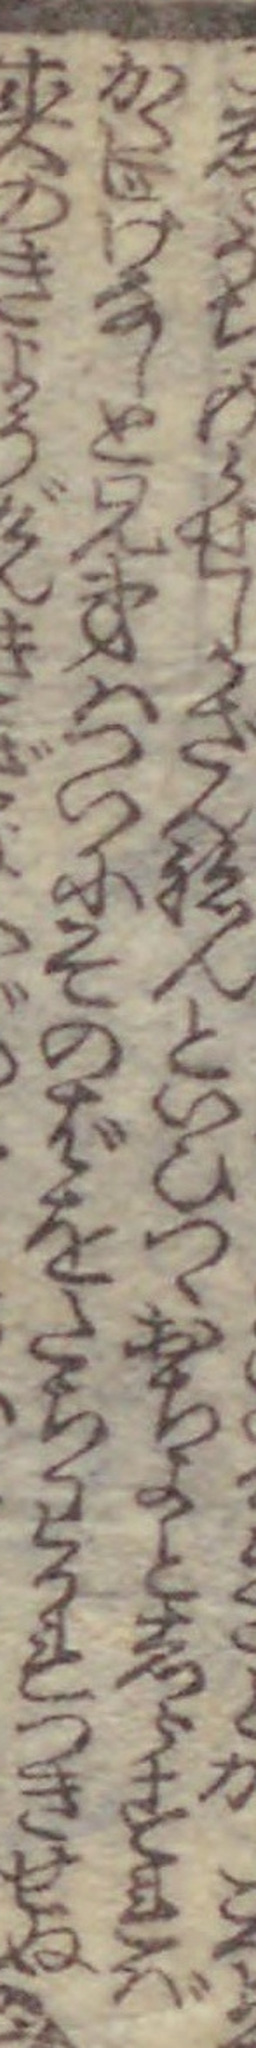かたじけなしと兄弟はついにそのばをたちわかれつきせぬ
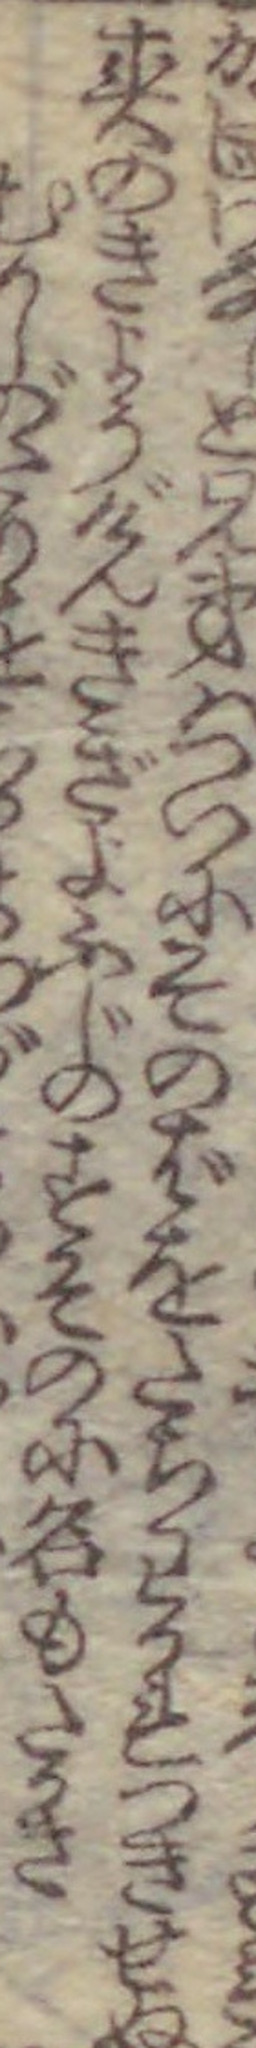爽のきようげんきぎよふじのすそのに名もたかき
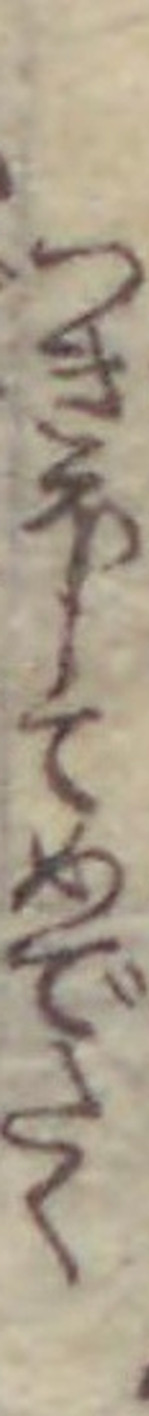つぎほしてめでたく
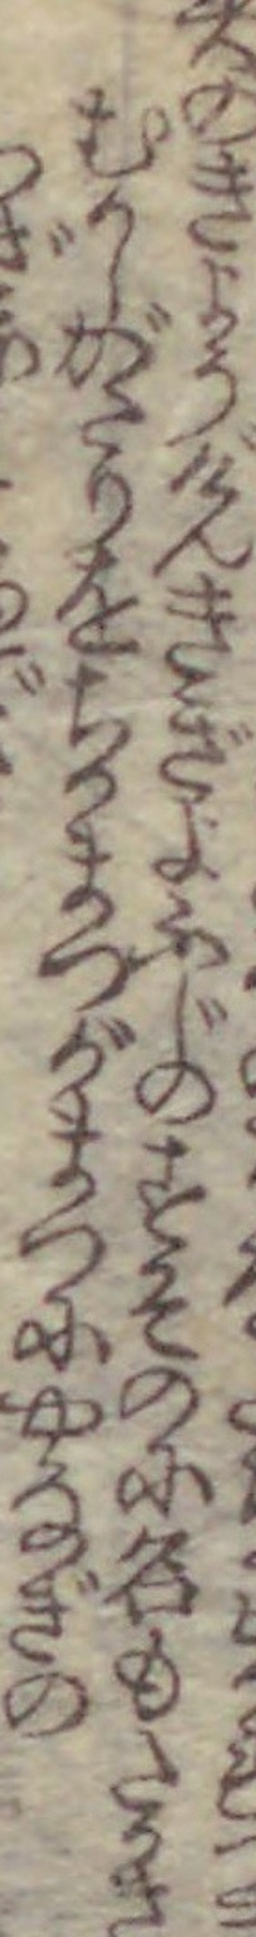むかしがたりをちかまつがまつにやなぎの
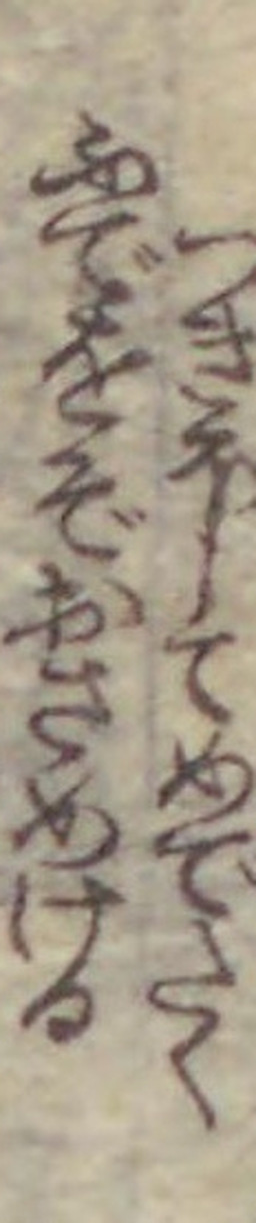ふでをぞおさめける
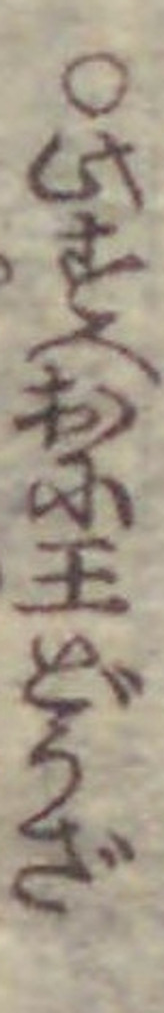○此すへおに王どうざ
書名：大時代唐土化物 3巻. 曽我太夫染
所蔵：国立国会図書館 National Diet Library, JAPAN
